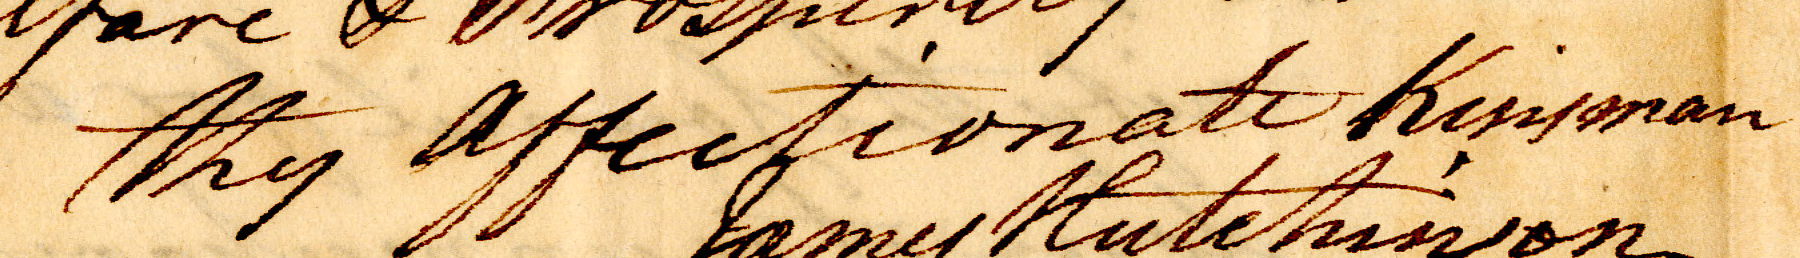thy affectionate Kinsman
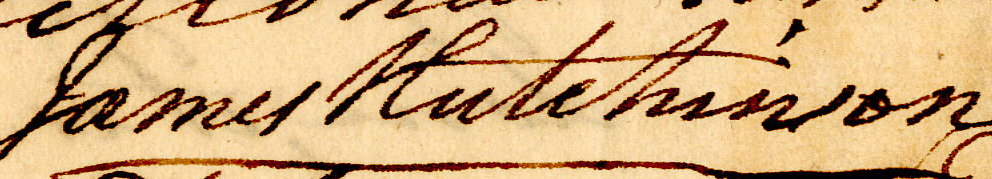James Hutchinson
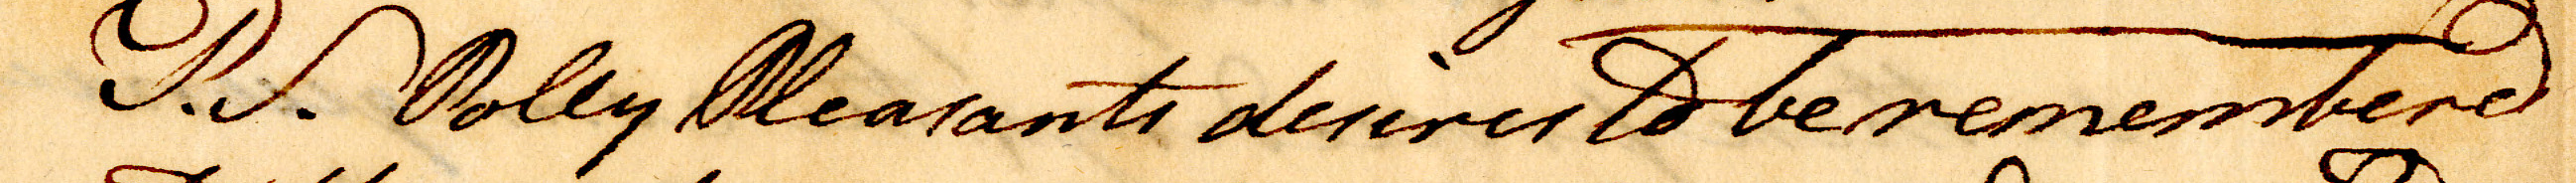P.S. Molly Pleasants desires to be remembered
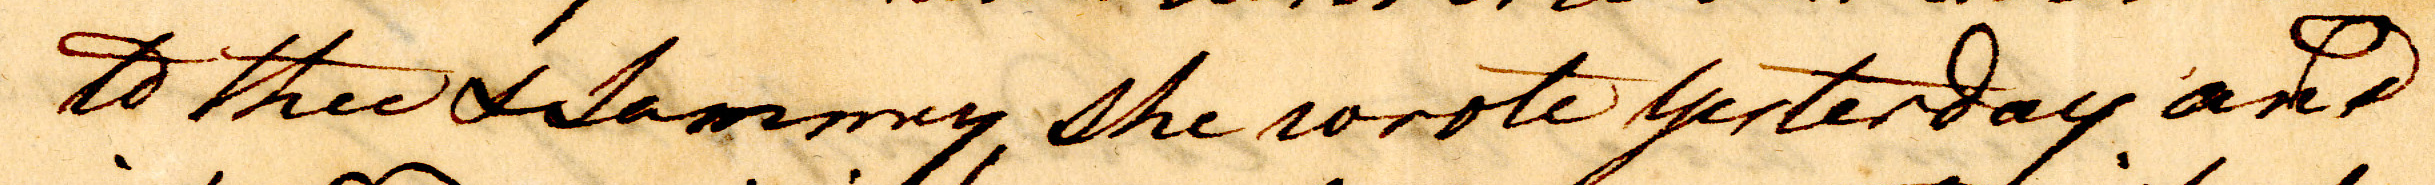to thee & Sammy, she wrote yesterday and
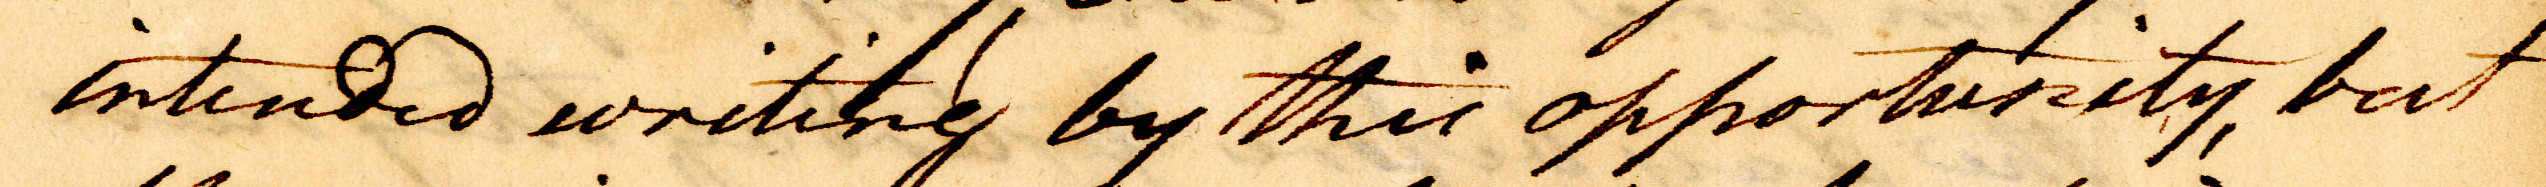intended writing by this opportunity, but
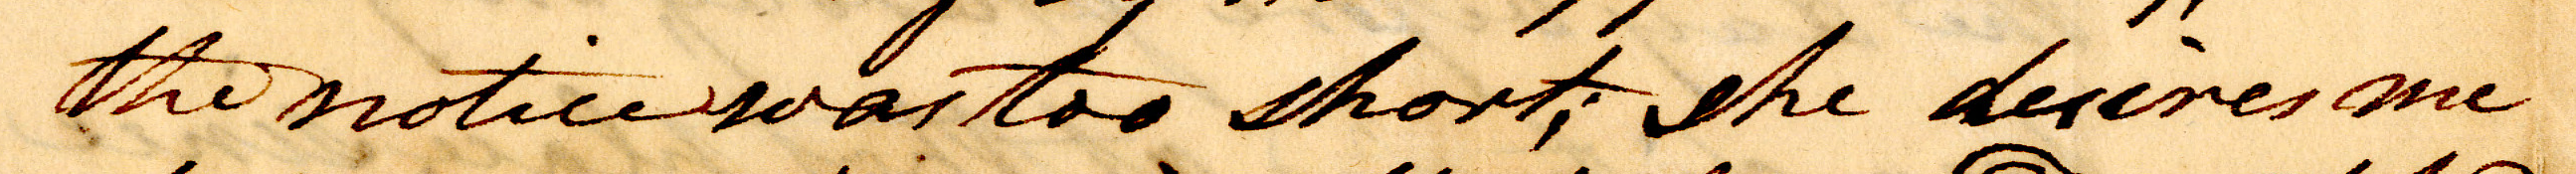the notice was too short; she desires me
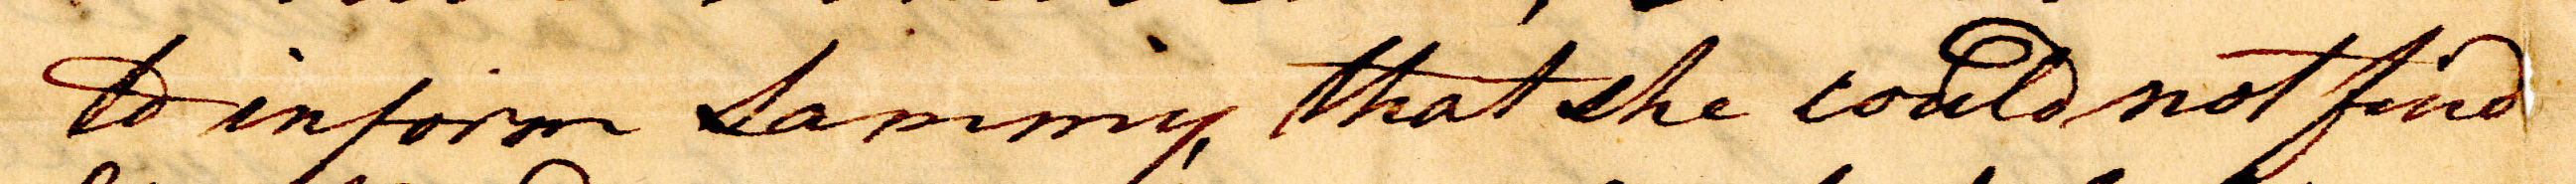to inform Sammy that she could not find
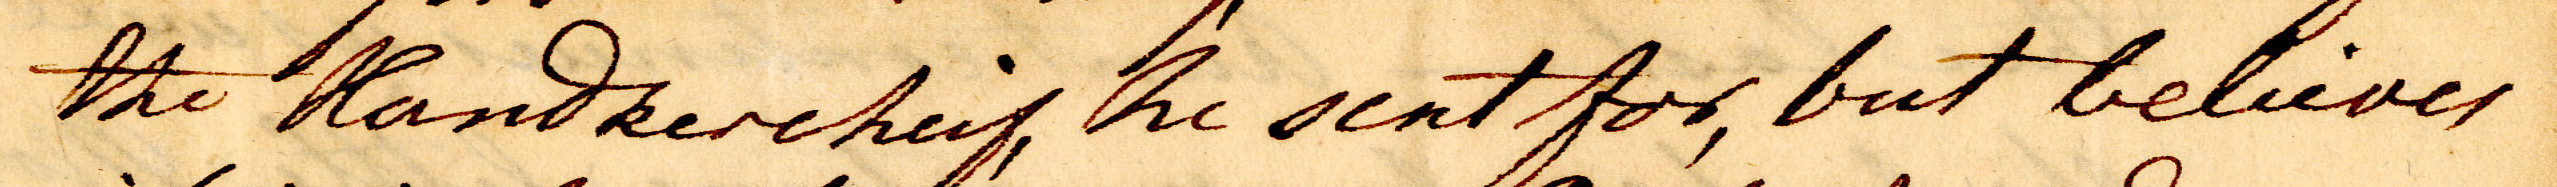the Handkerchief he sent for, but believes
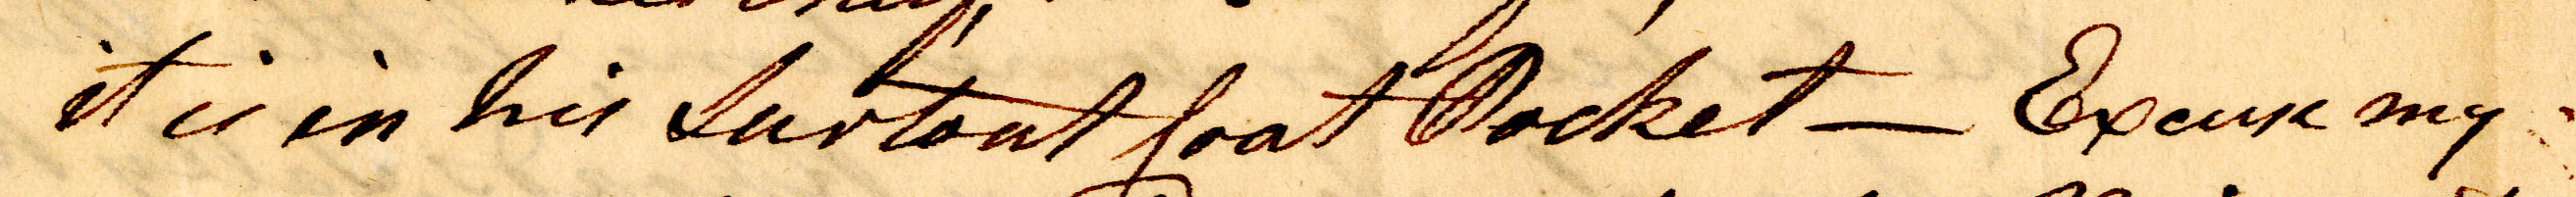it is in his Surtout Coat Pocket- Excuse my
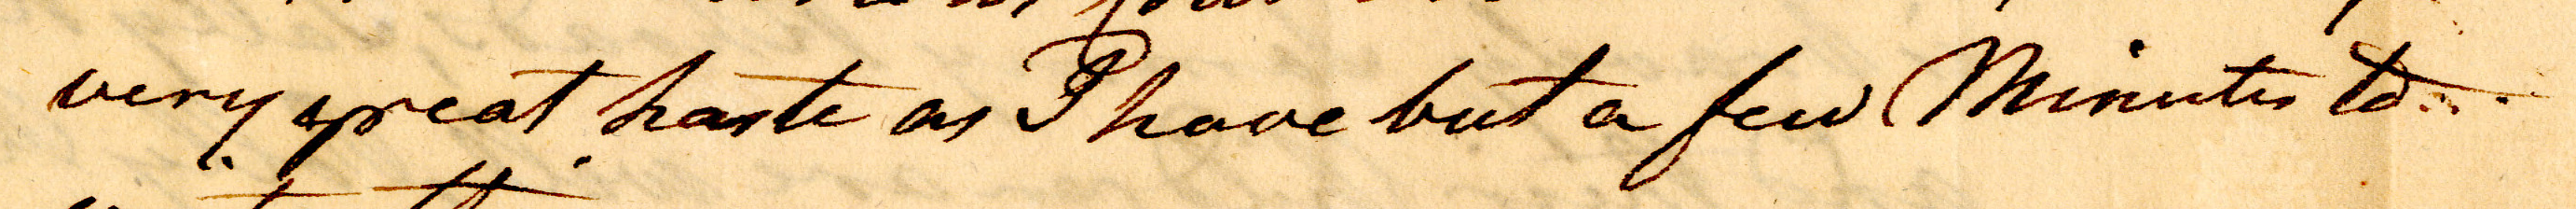very great haste as I have but a few Minutes to
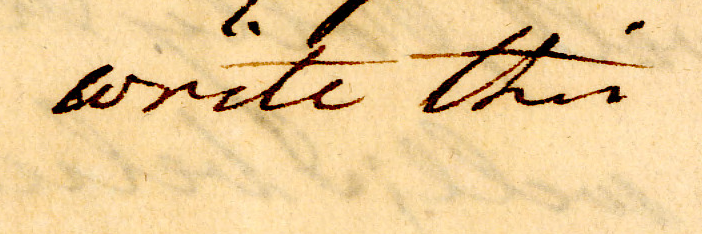write this
